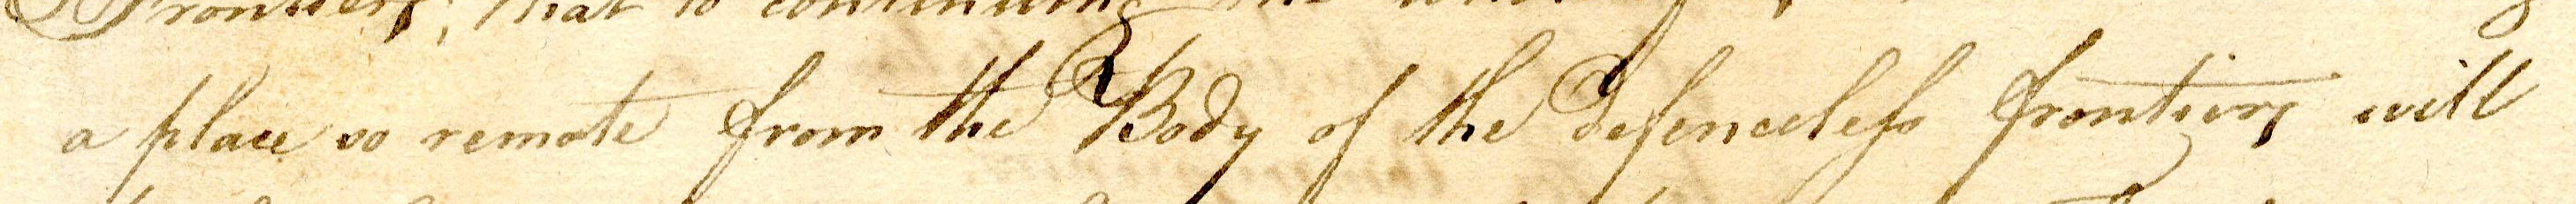a place so remote from the Body of the defenceless frontiers will
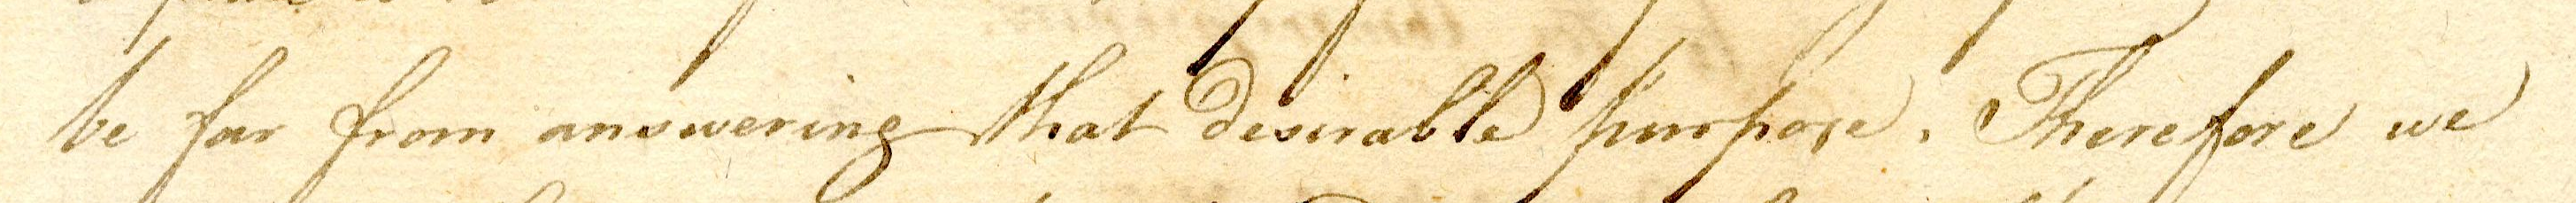be far from answering that desirable purpose. Therefore we
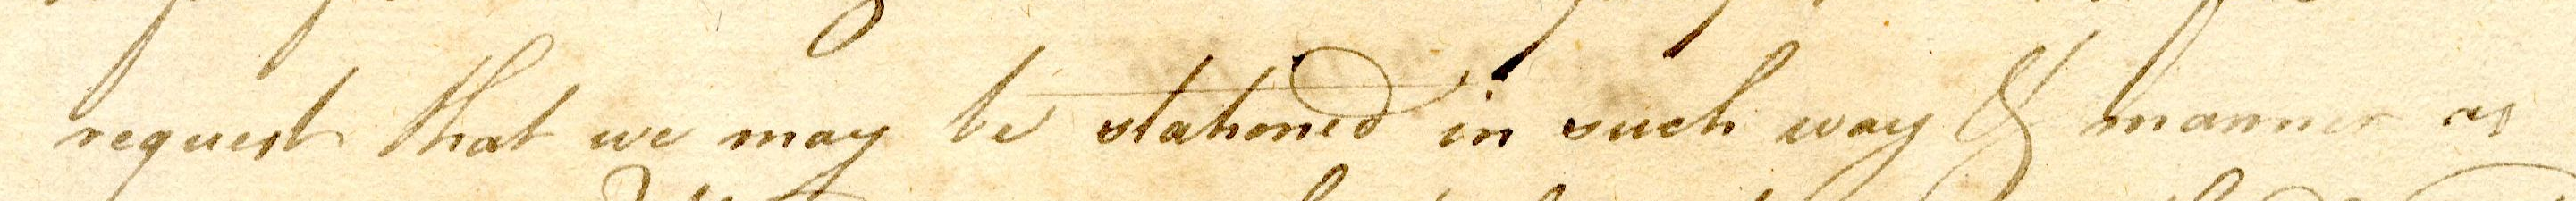request that we may be stationed in such way & manner as
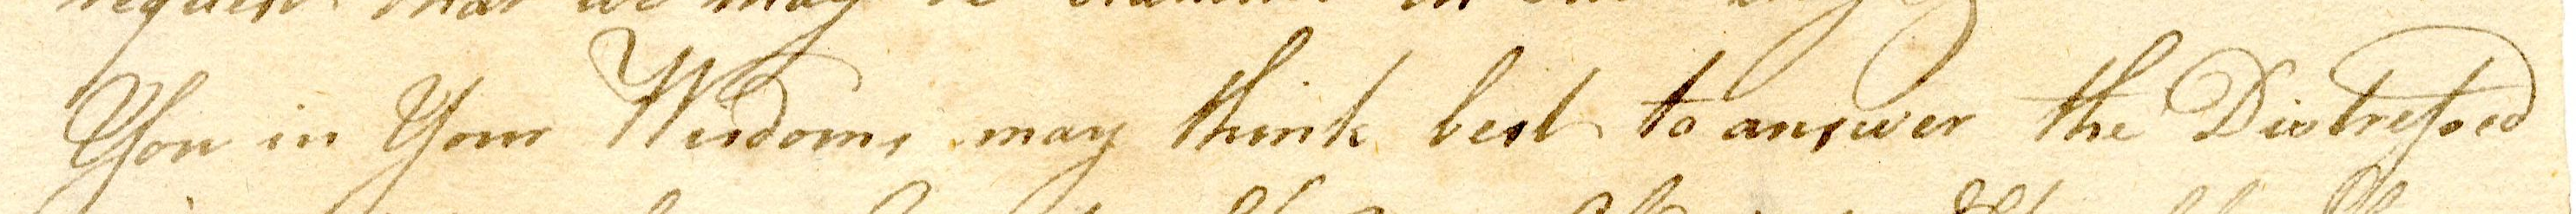You in Your Wisdoms may think best to answer the Distressed
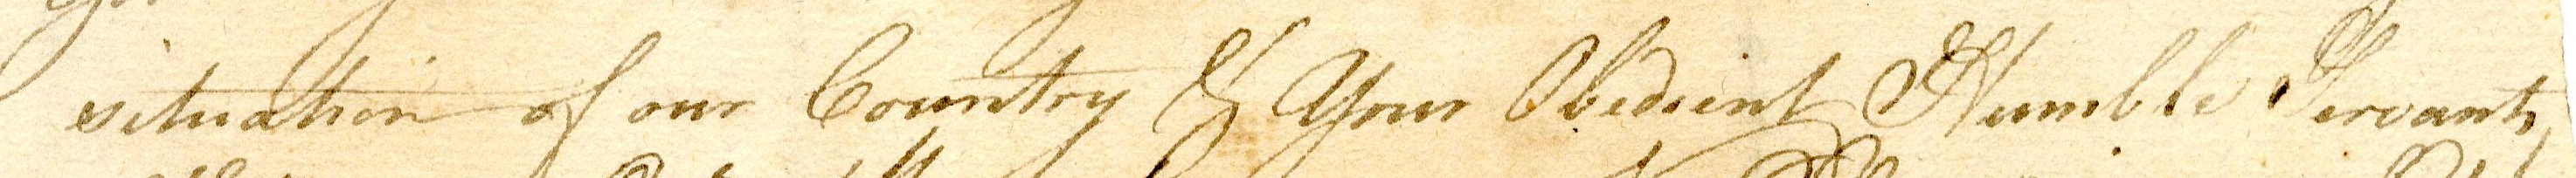situation of our Country & Your Obedient Humble Servants
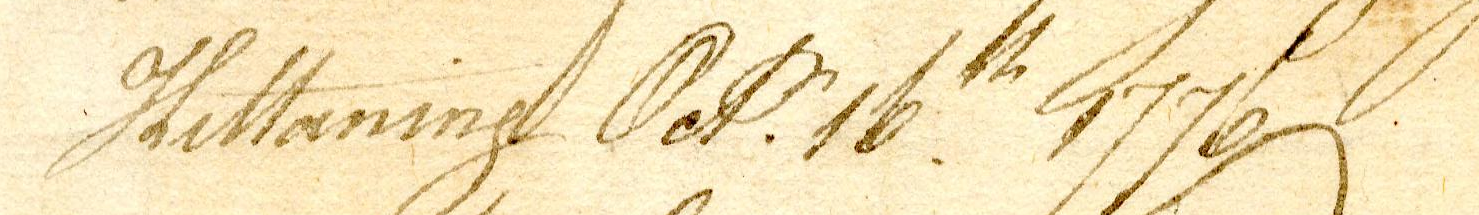Kittaning Oct^r. 16^th. 1776
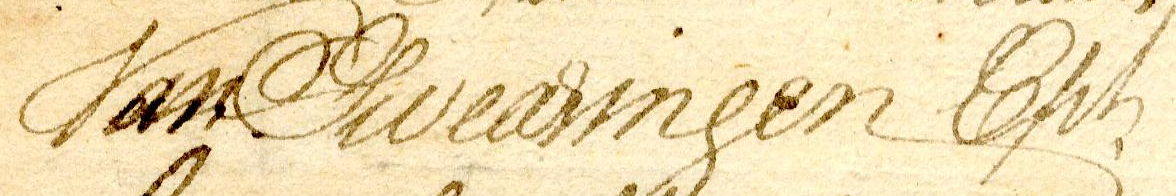W^m Swearingen Cpt.
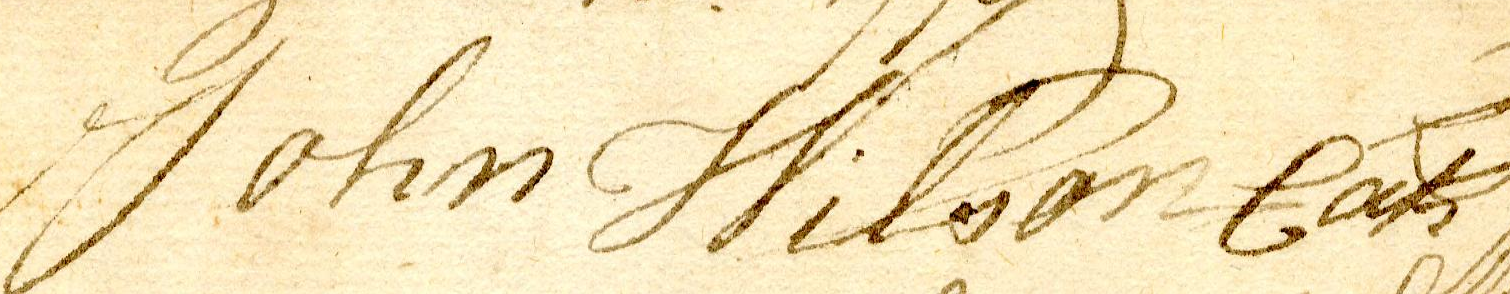John Wilson Capt
